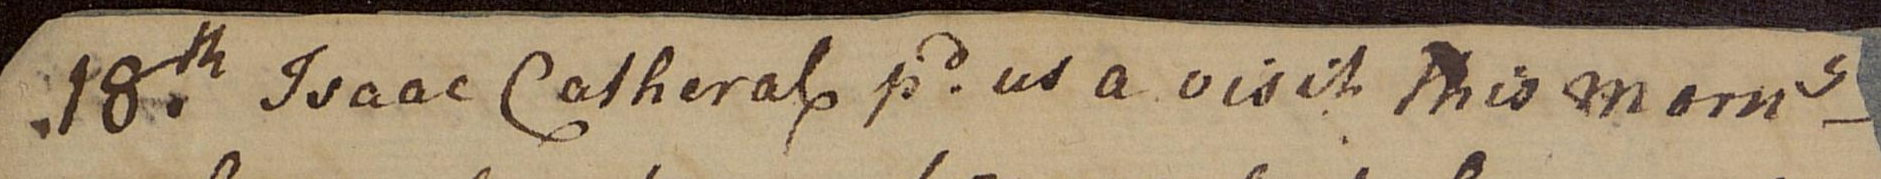18^th. Isaac Catheral p^d. us a visit this morn^g-
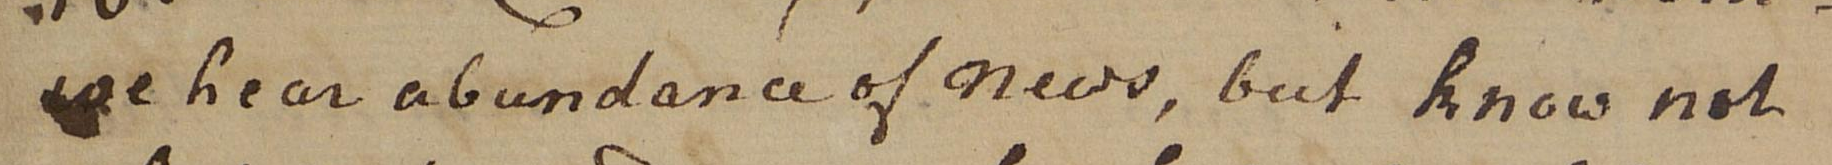we hear abundance of News, but know not
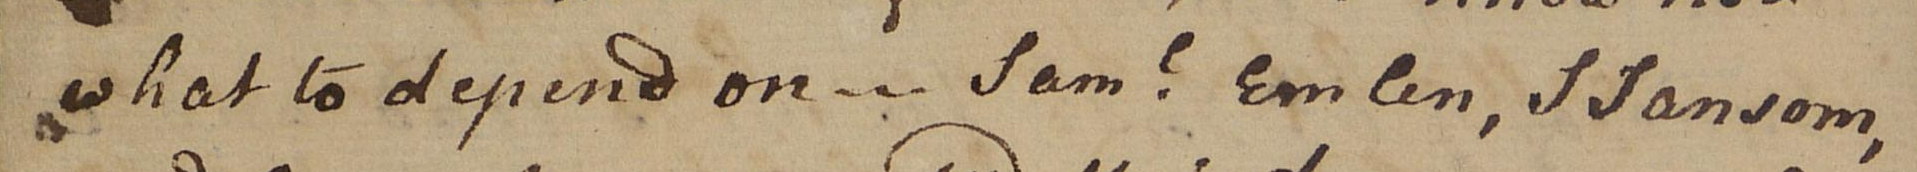what to depend on- Sam^l. Emlen, S Sansom,
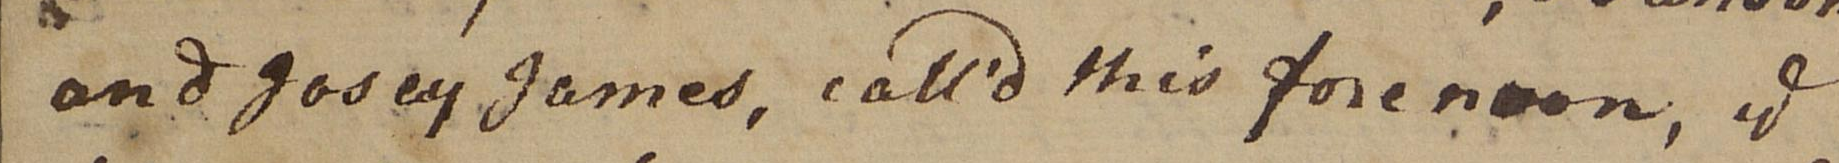and Josey James, call'd this forenoon, y^e
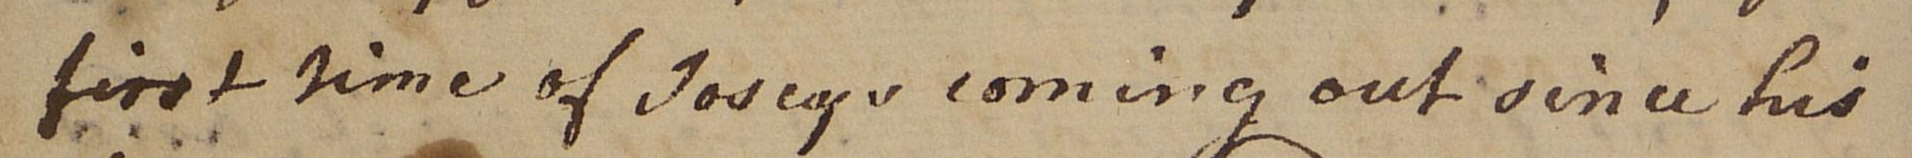first time of Joseys coming out since his
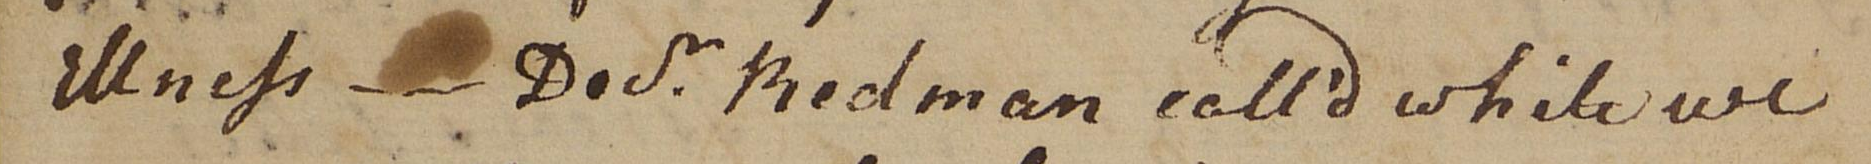Illness - Doc^r. Redman call'd while we
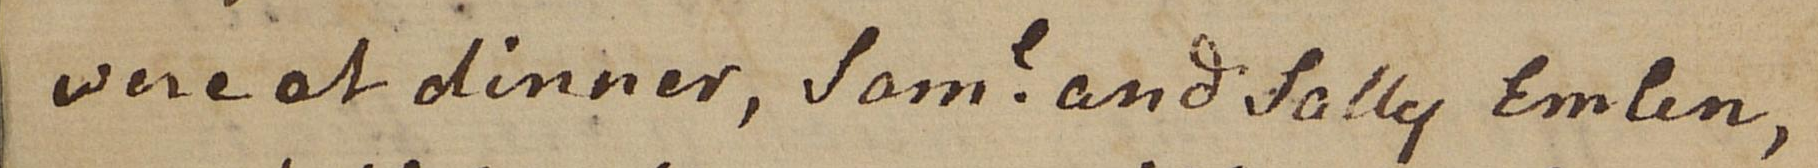were at dinner, Sam^l. and Sally Emlen,
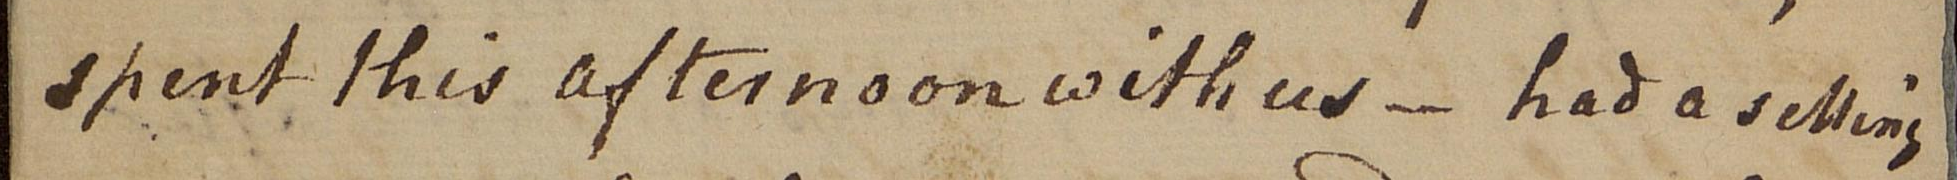spent this afternoon with us- had a setting
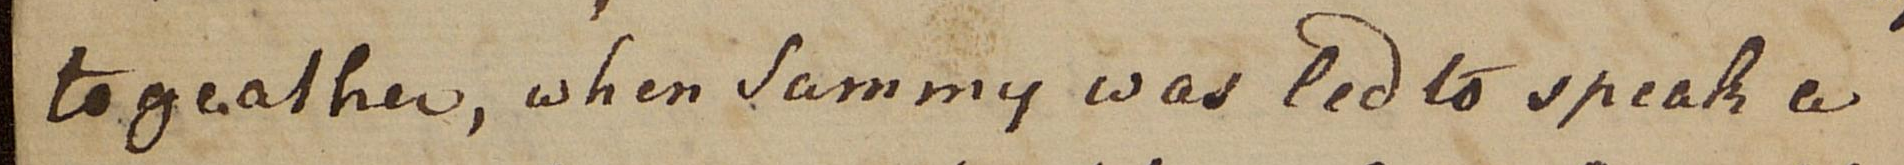to geather, when Sammy was led to speak a
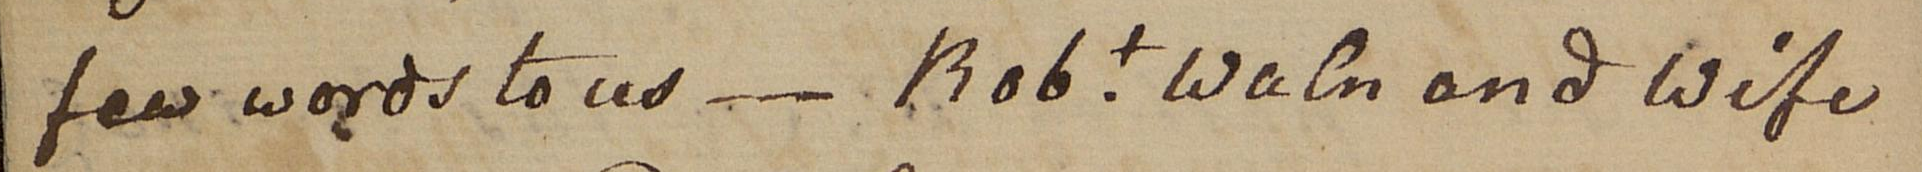few words to us- Rob^t. Waln and Wife
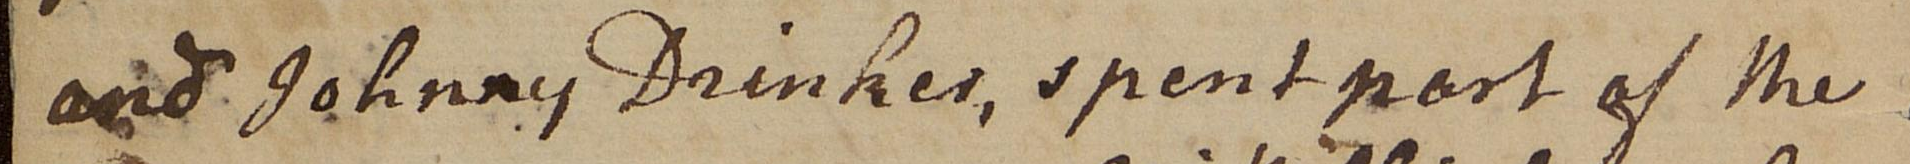and Johnny Drinker, spent part of the
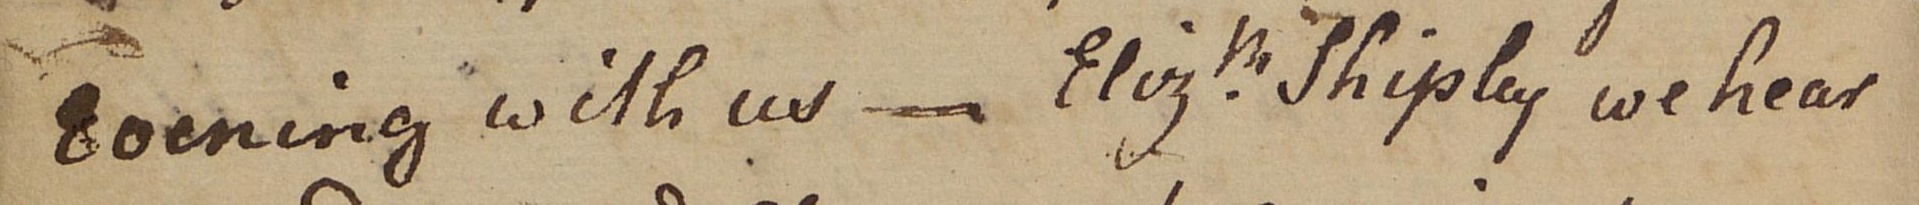Evening with us - Eliz^th. Shipley we hear
